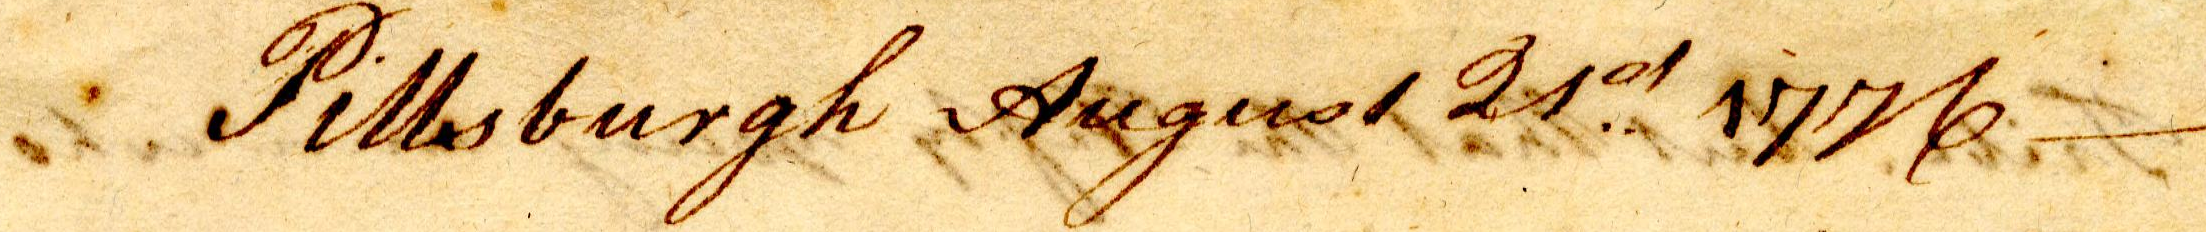Pittsburgh August 21^st. 1776-
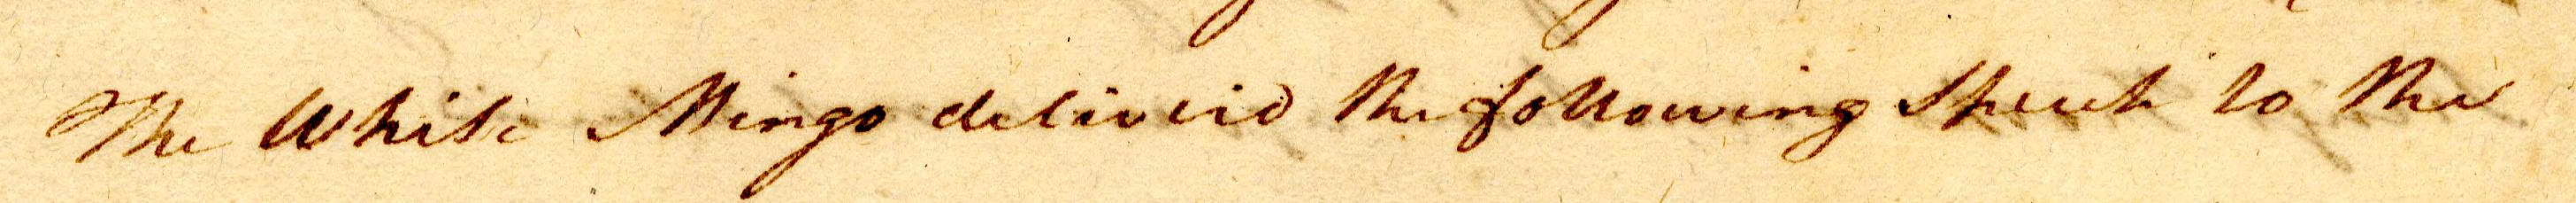The White Mingo deliver'd the following Speech to the
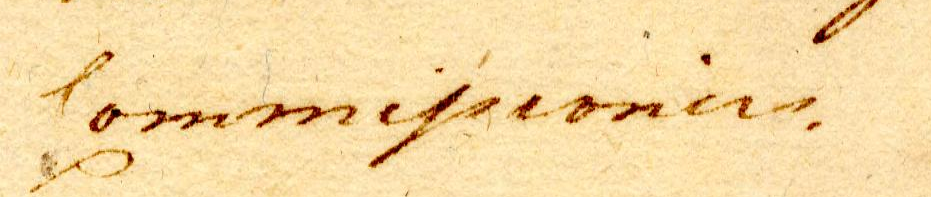Commissioners.
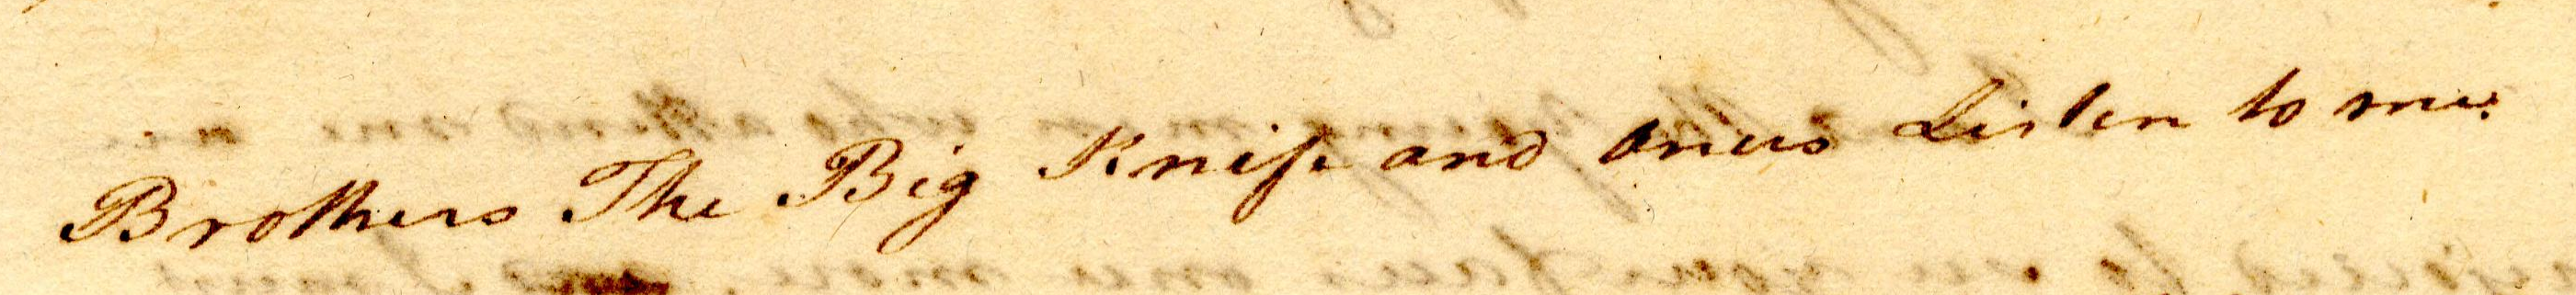Brothers The Big Knife and others Listen to me
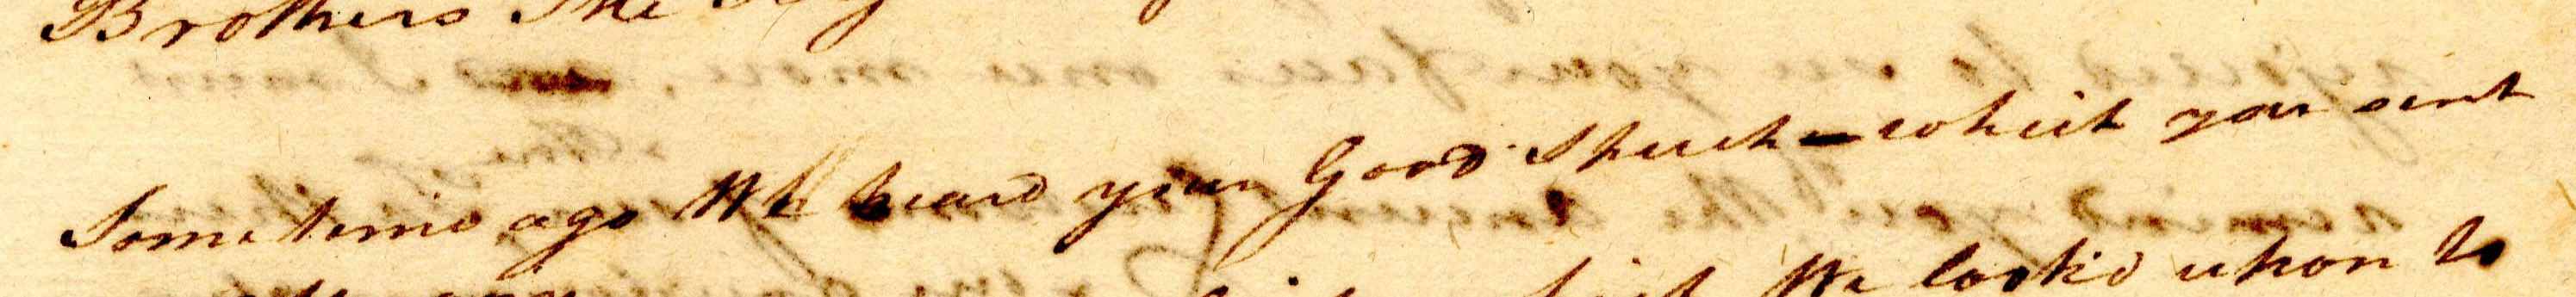some time ago we heard your good speech which you sent
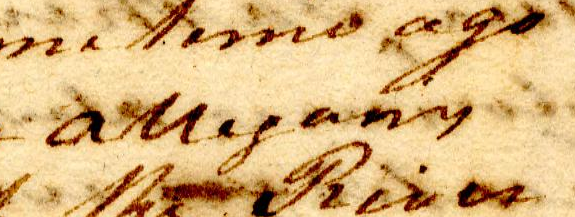allegany
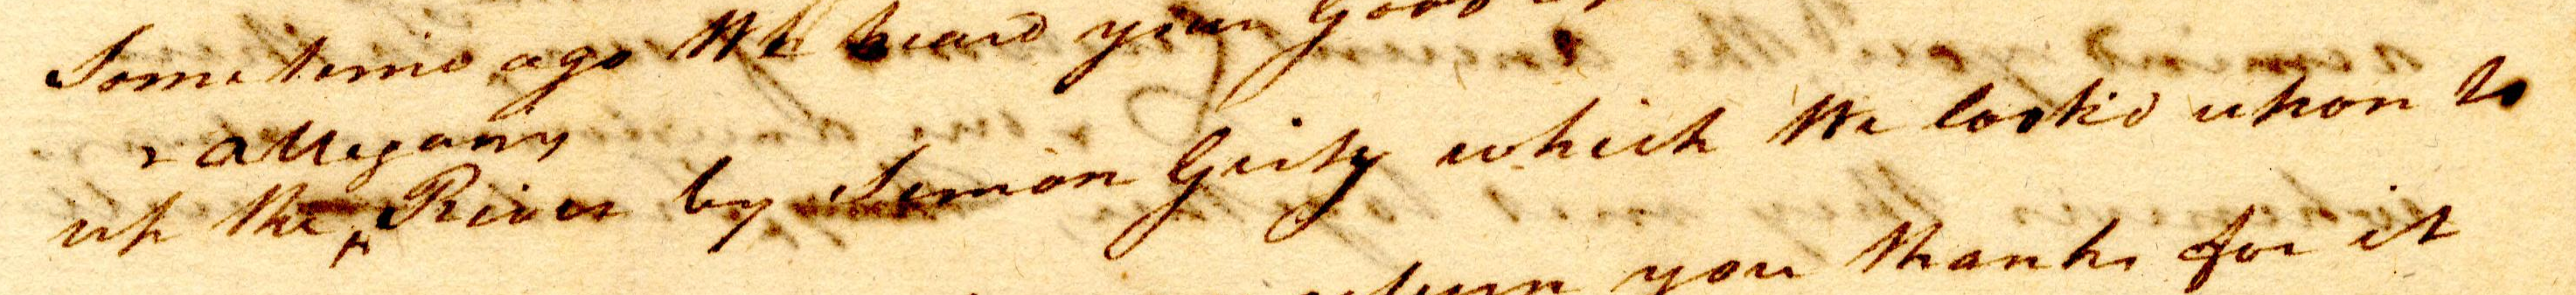up the ^ River by Simon Girty which we look'd upon to
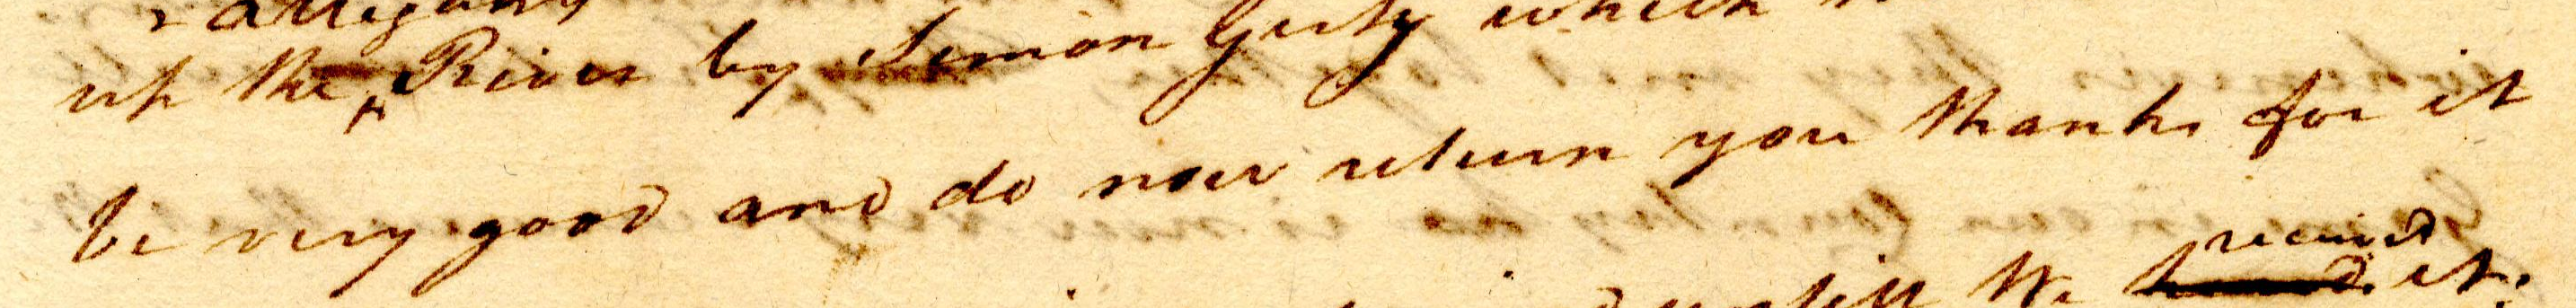be very good and do now return you thanks for it
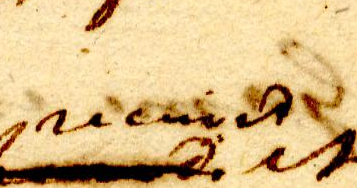received
